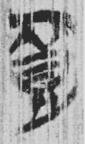飤（食）
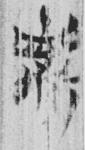若
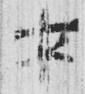才（在）
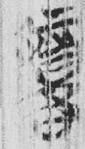腹
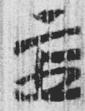𠁩
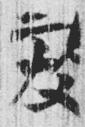攷（巧）
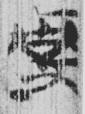○（變）
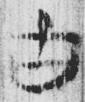古（故）
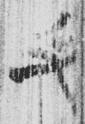父
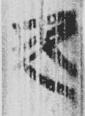母（母）
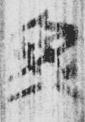安
